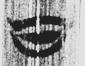日
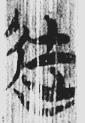徒
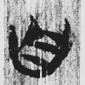自
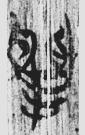○（關）
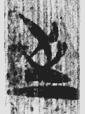至（致）
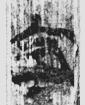命
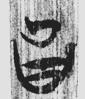昌
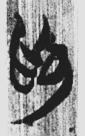爲
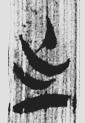之
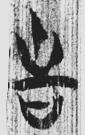告
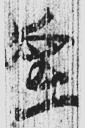○（吾）
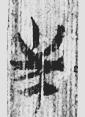未
